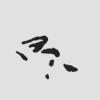是
